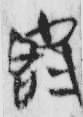既
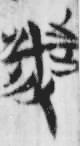發
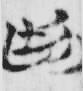○（廷）
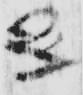疋
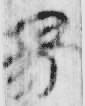昜（陽）
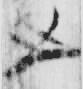之
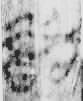酷
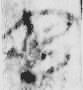官
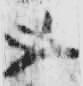之
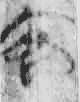客
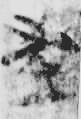往
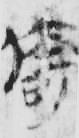倚
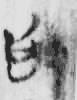爲
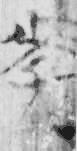李
